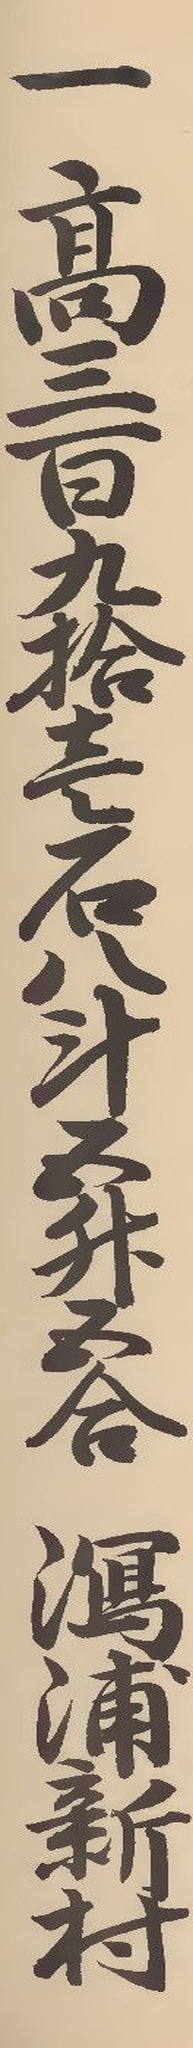一高三百九拾壱石八斗五升五合潟浦新村
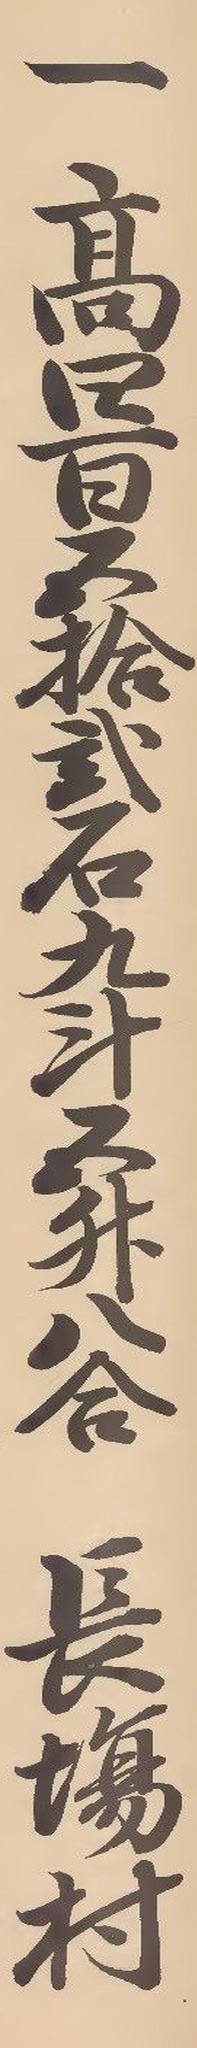一高四百五拾弐石九斗五升八合長場村
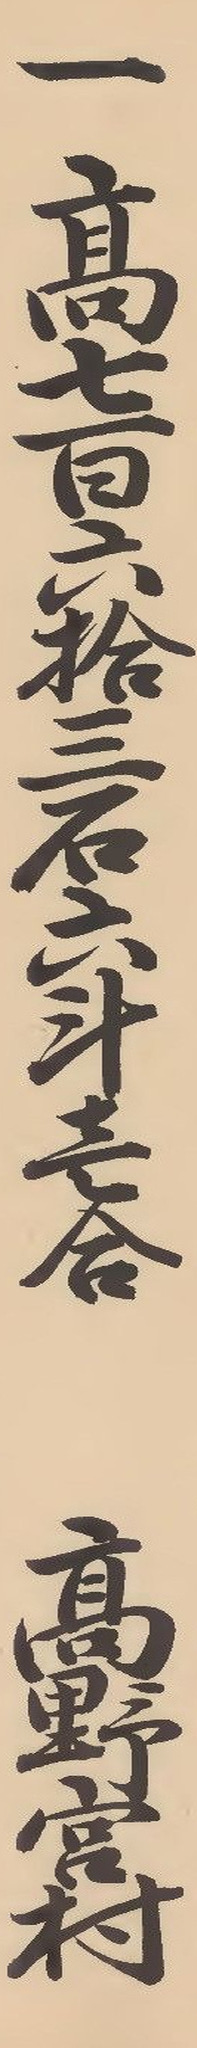一高七百六拾三石六斗壱合高野宮村
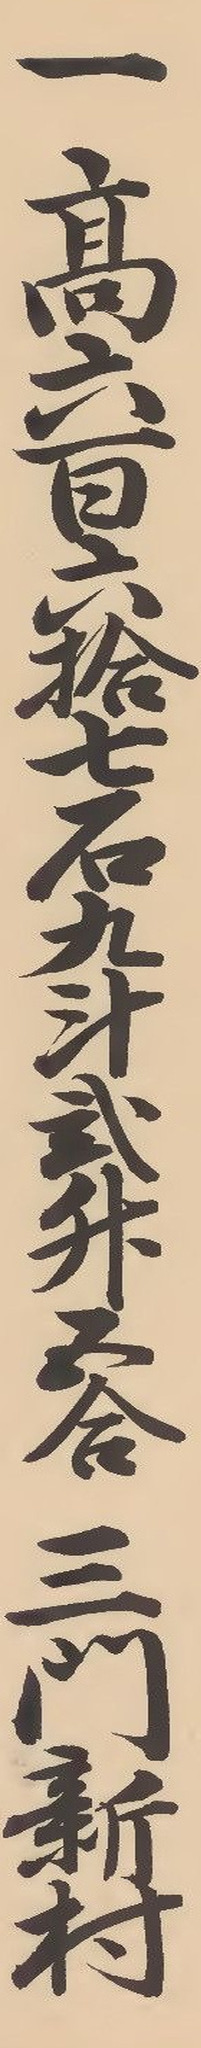一高六百六拾七石九斗弐升五合三門新村
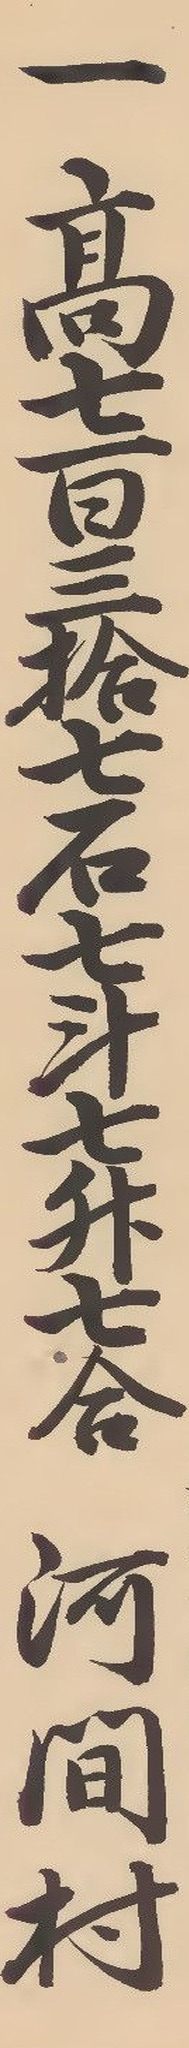一高七百三拾七石七斗七升七合河間村

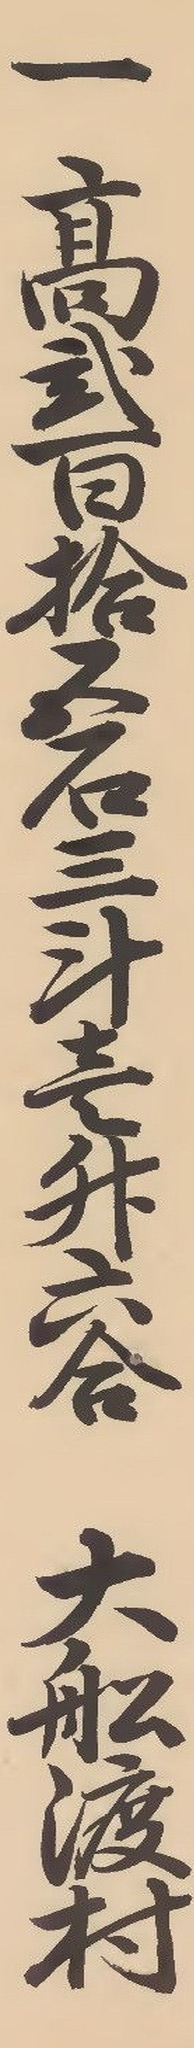一高弐百拾五石三斗壱升六合大船渡村
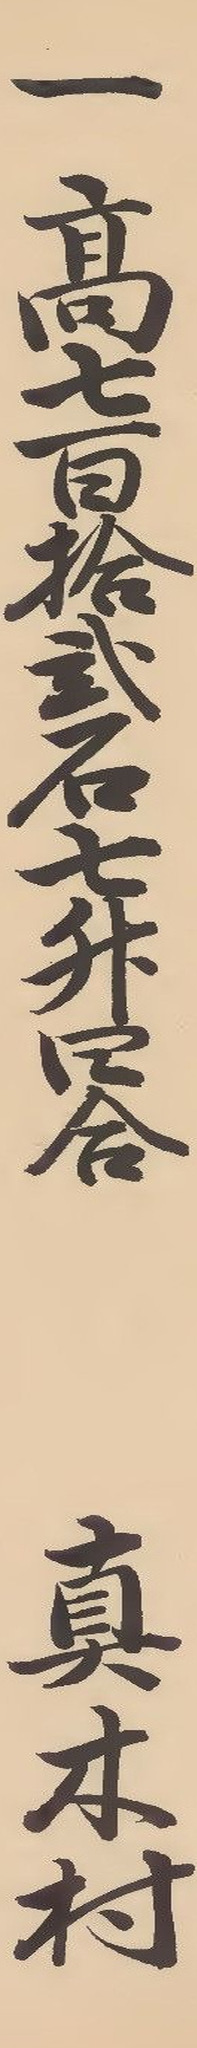一高七百拾弐石七升四合真木村
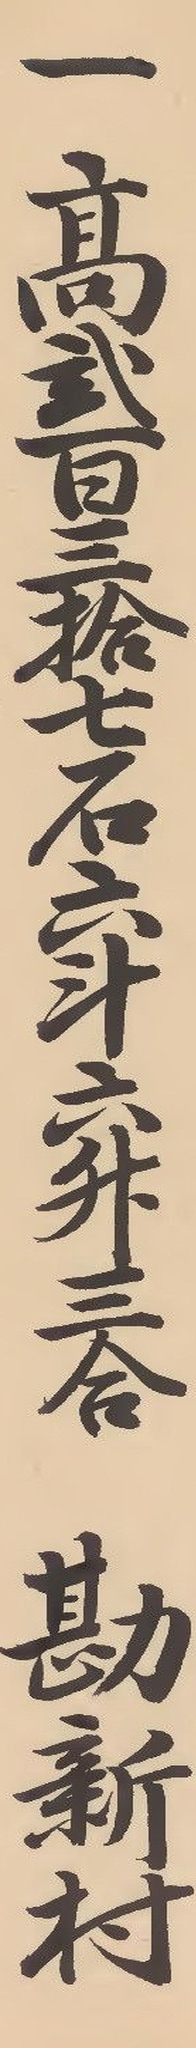一高弐百三拾七石六斗六升三合勘新村
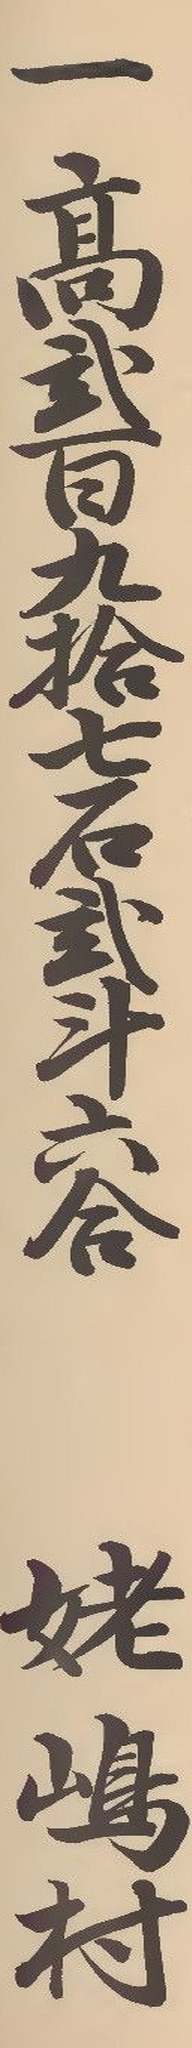一高弐百九拾七石弐斗六合姥島村
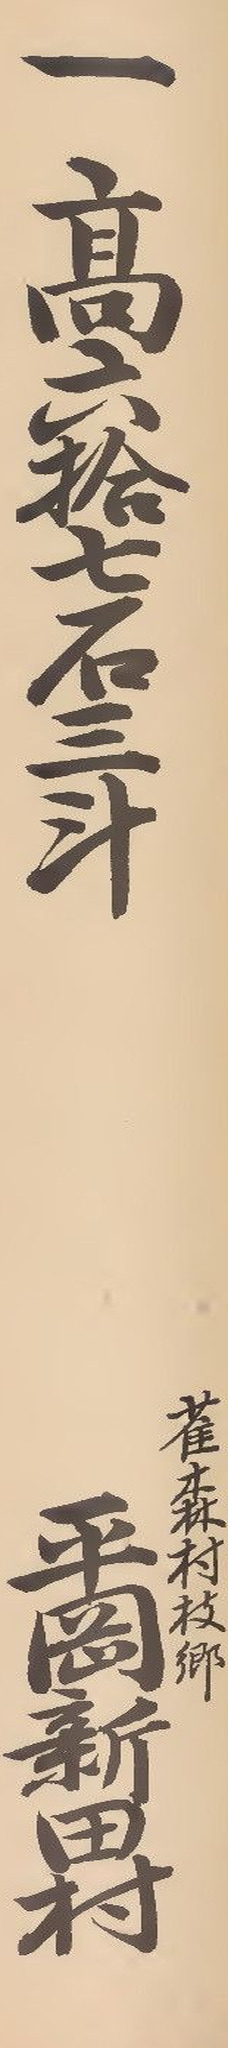一高六拾七石三斗平岡新田村
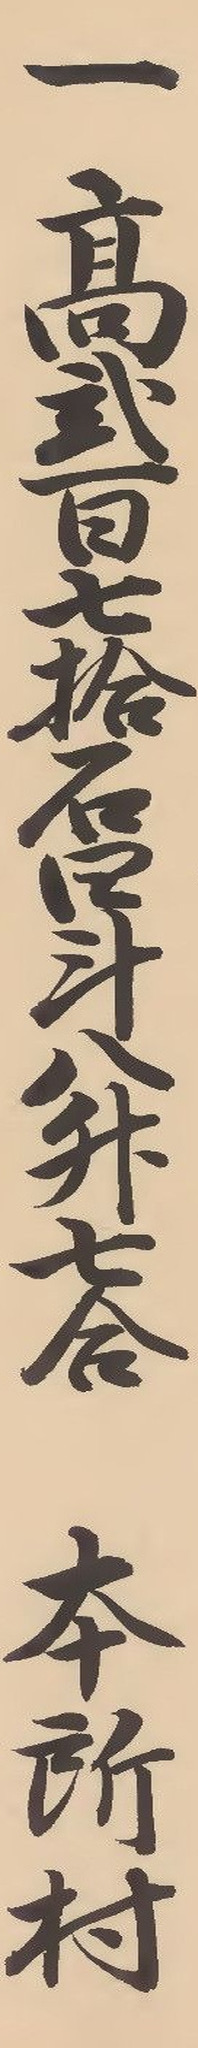一高弐百七拾石四斗八升七合本所村
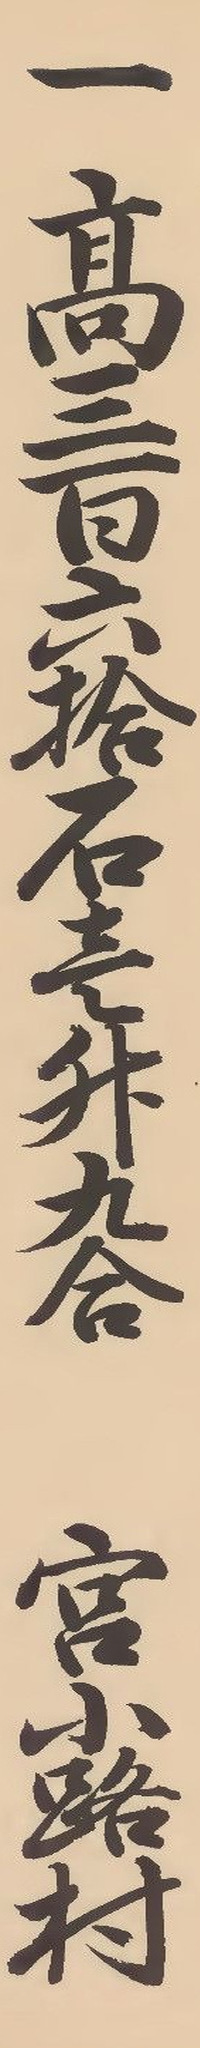一高三百六拾石壱升九合宮小路村
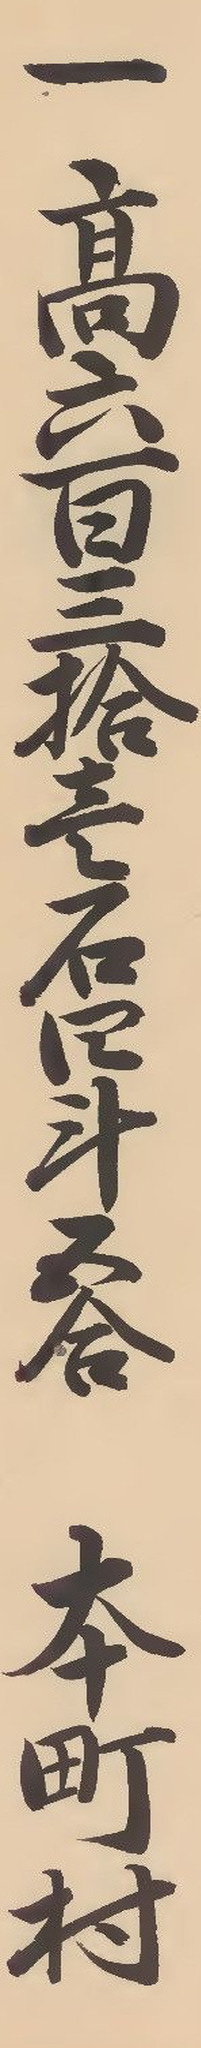一高六百三拾壱石四斗五合本町村

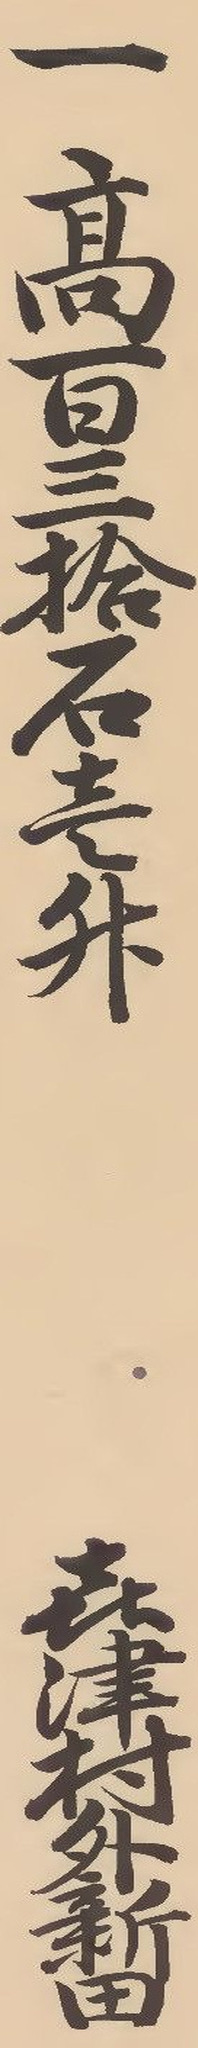一高百三拾石壱升喜津村外新田
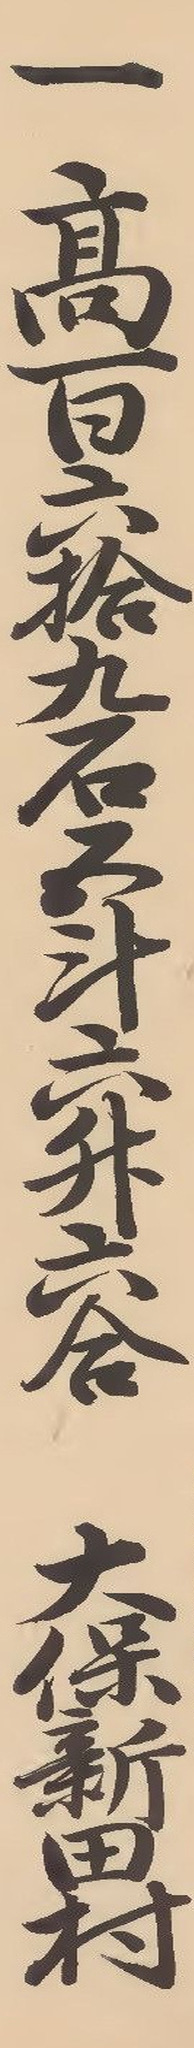一高百六拾九石五斗六升六合大保新田村
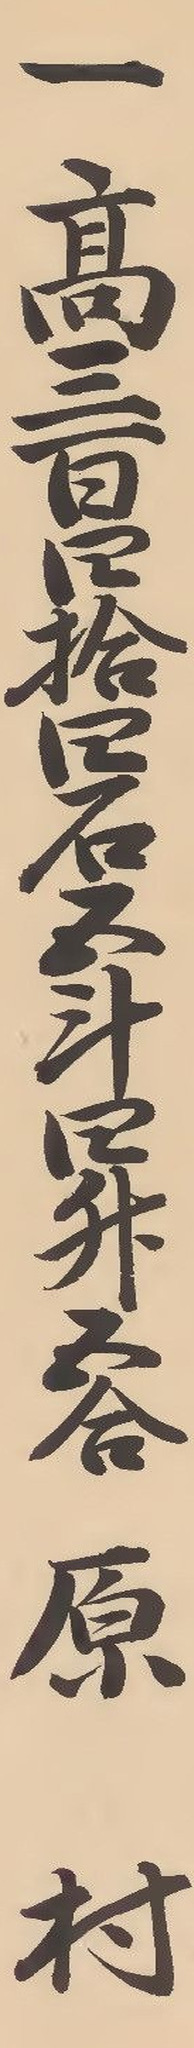一高三百四拾四石五斗四升五合原村
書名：越後国郷帳　下
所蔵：国立公文書館 National Archives of Japan
